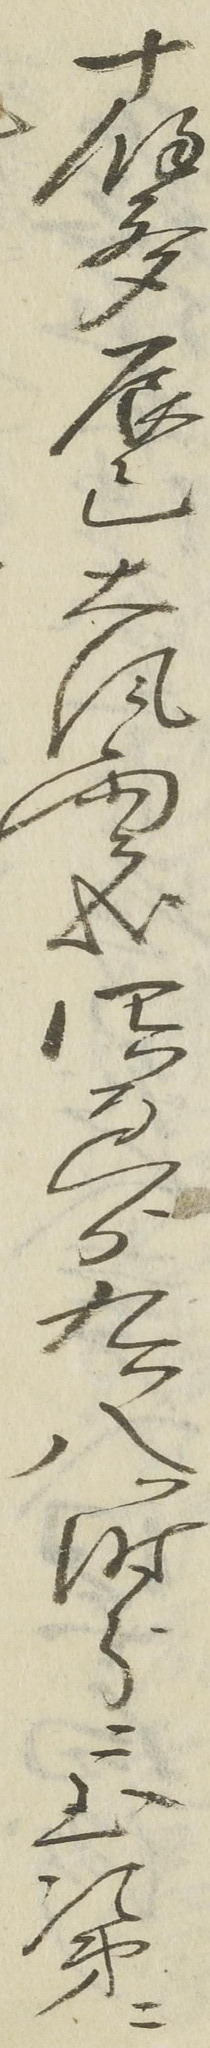十余多辰巳大風雨に成四ッ過ゟ九つ八つ時分に至次第に
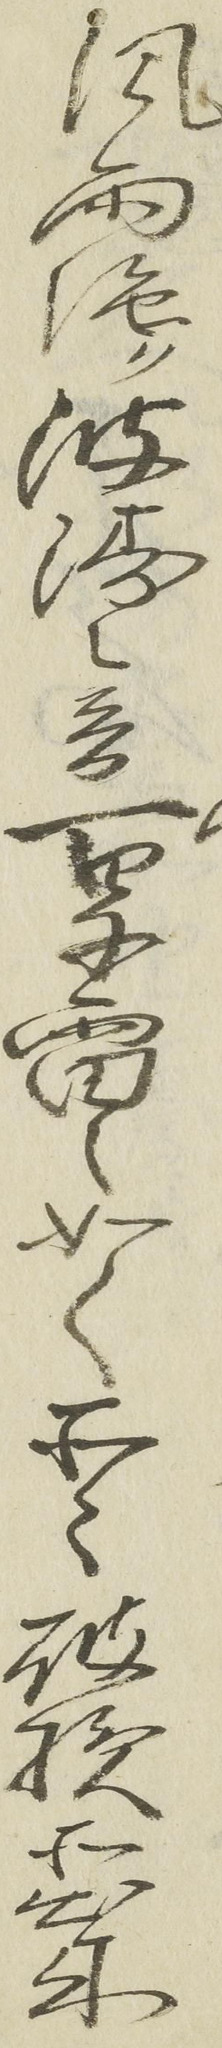風雨強ク波濤之音百千雷之如く所〻破損所出来
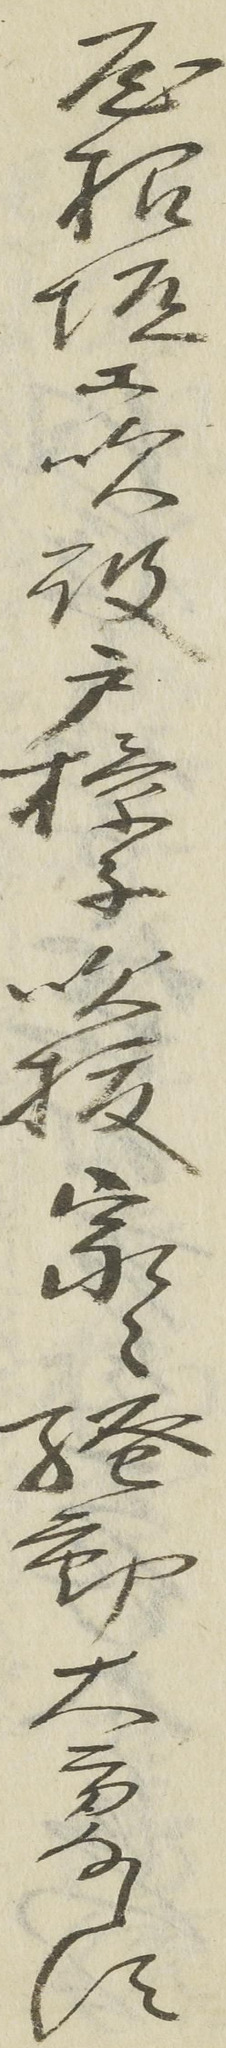屋根垣へ吹破戸障子吹抜家〻騒動大方ならす
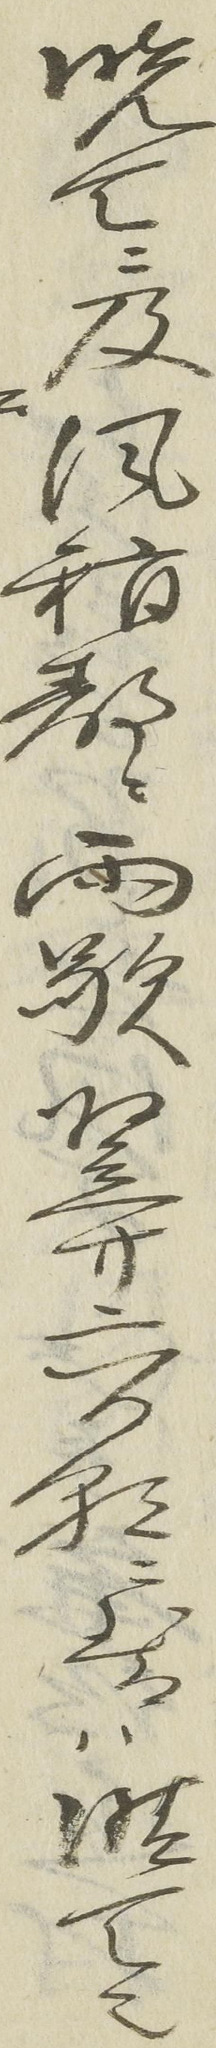晩天ニ及風稍静ニ雨歇翌廿六日朝ニ到而ハ晴天也
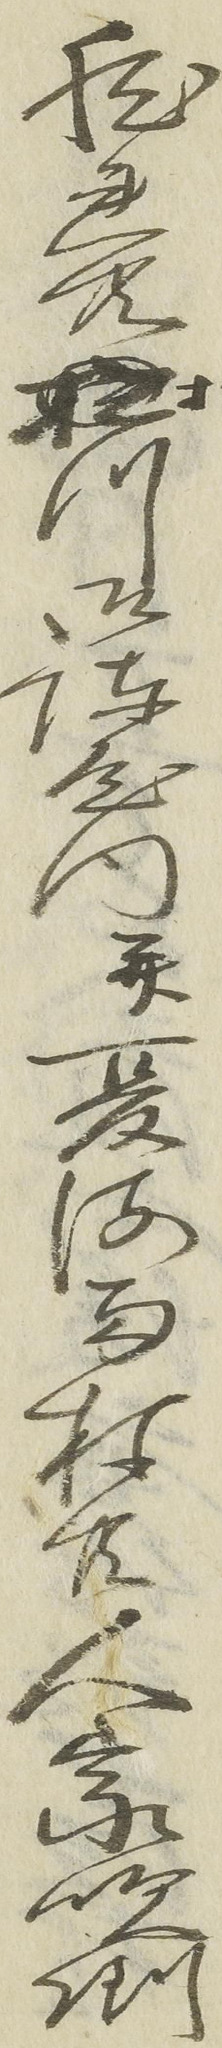然れ共松川御陣屋内并夏海両村共人家吹倒
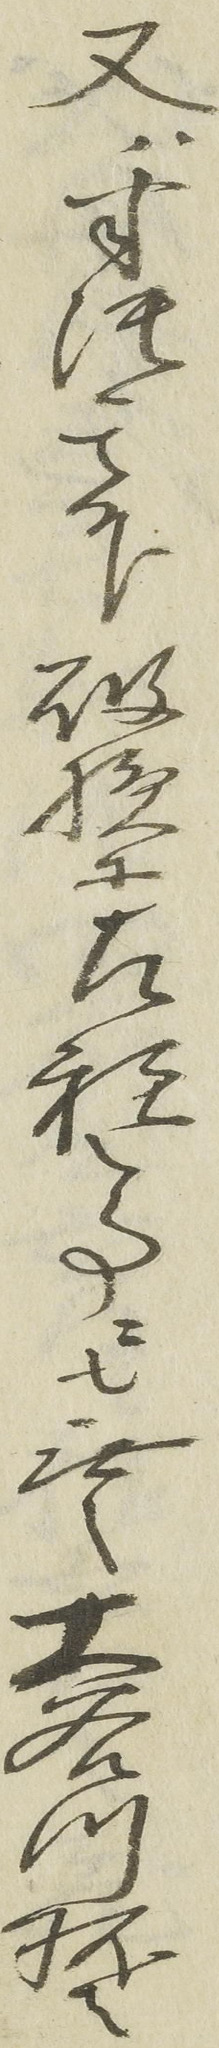又ハ半潰其外破損等左程之事ニも無之大谷川抔は
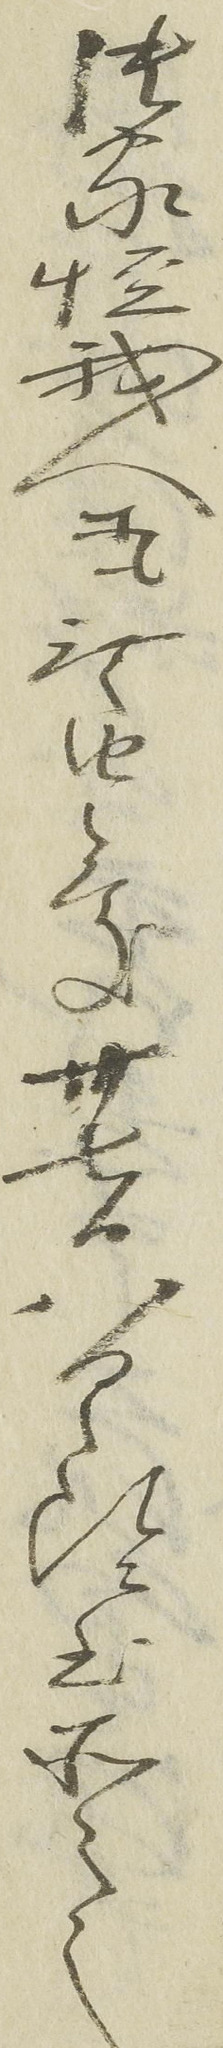潰家怪我人等も無之由候処廿七日八日比ニ至所〻之

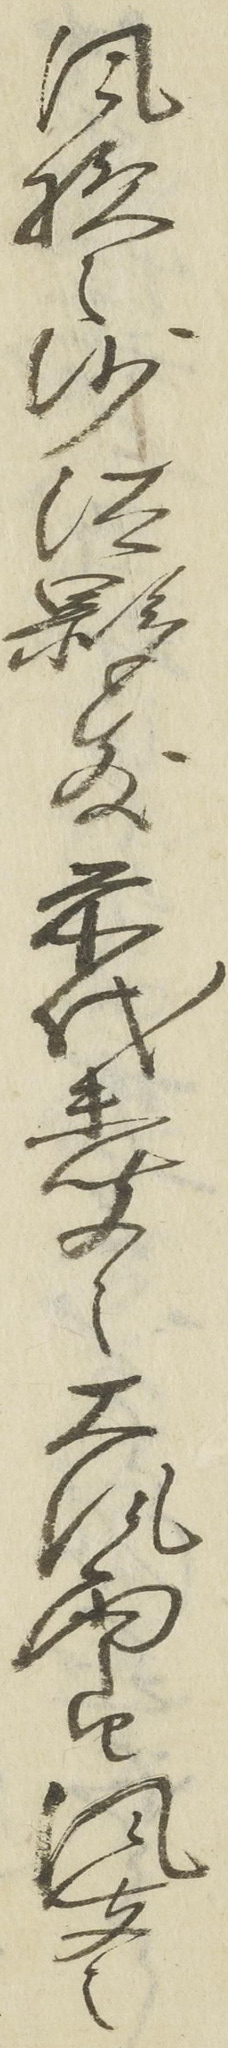風損之沙汰夥敷前代未聞之大風雨由風聞之
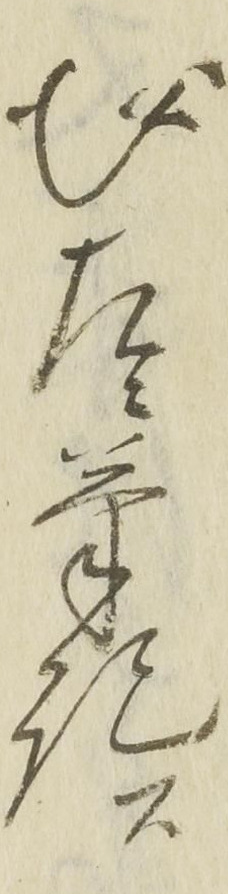趣左ニ筆記ス
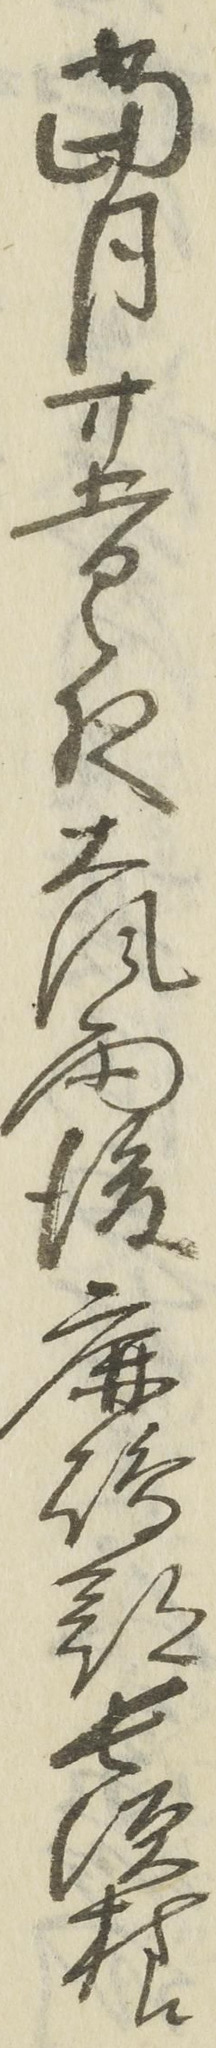当月廿五日之夜大風雨後鹿嶋郡長須村江
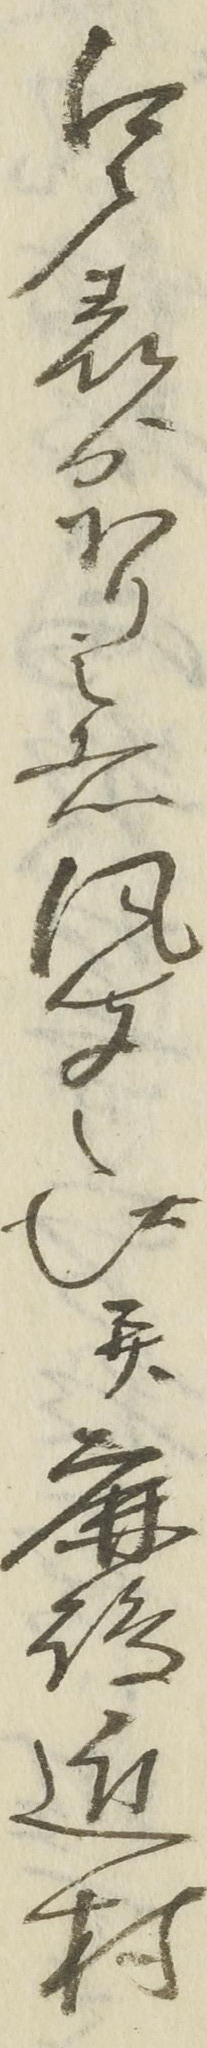江戸表ゟ下り之者風聞之趣并鹿嶋近村
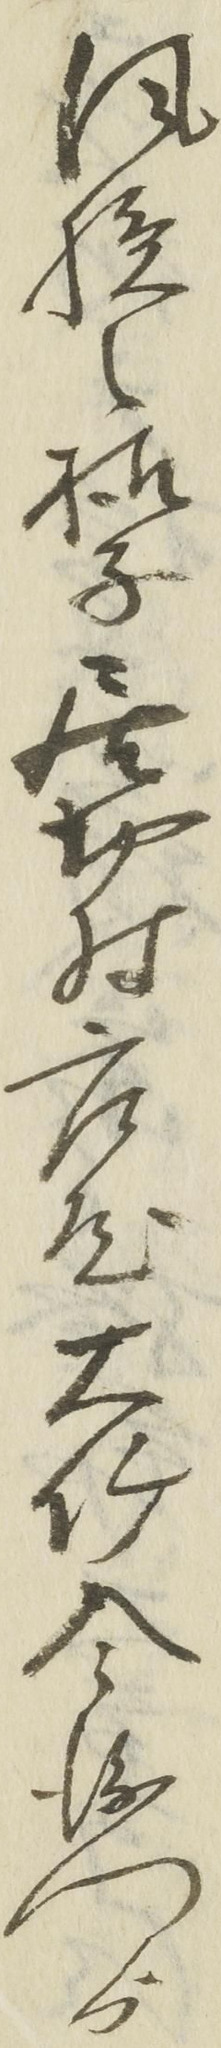風損之様子居切村庄屋大竹今衛門ゟ
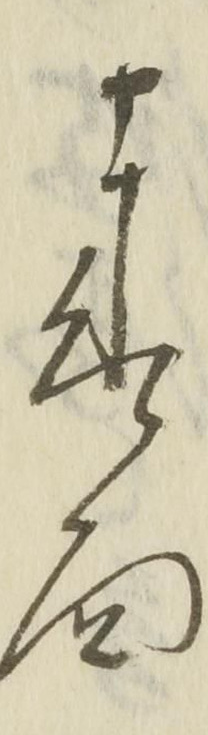申来候面
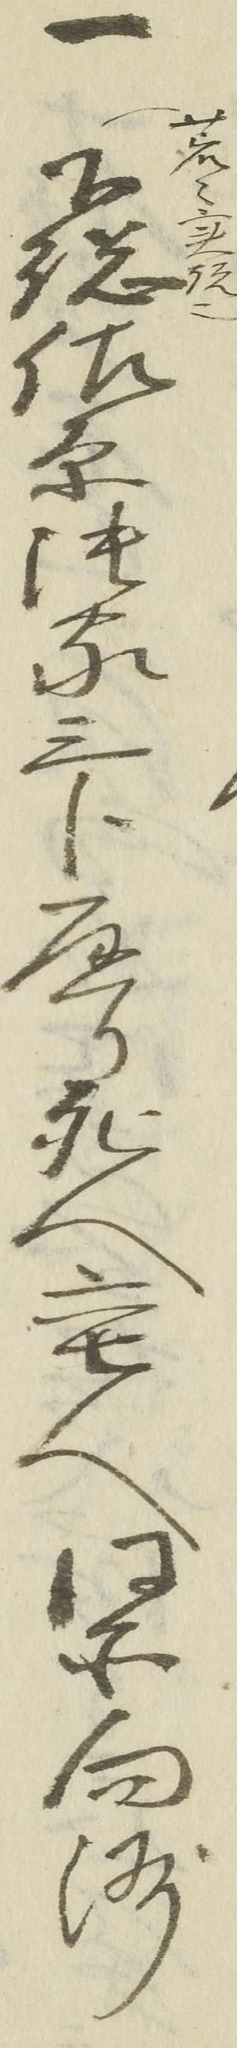一下総佐原潰家三分通り死人六七人同所向洲
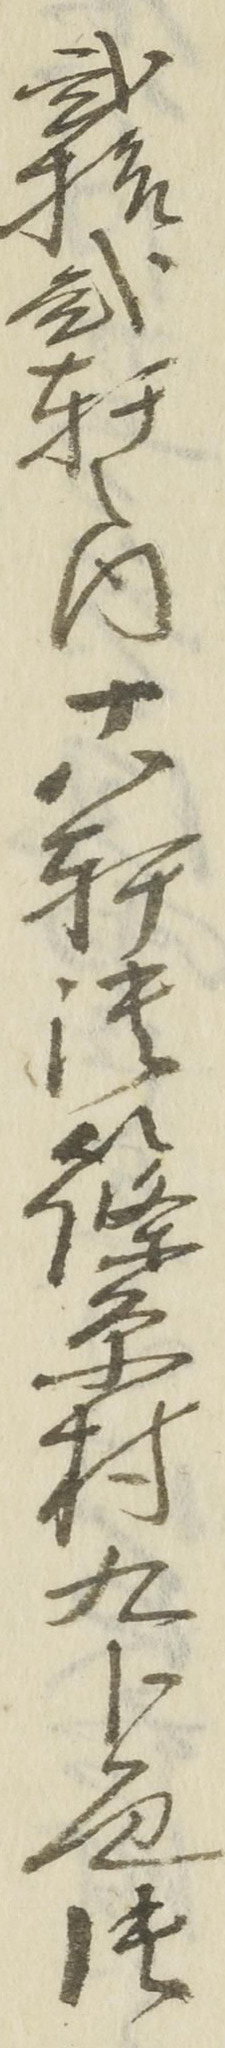弐拾弐軒之内十八軒潰篠原村九分通潰
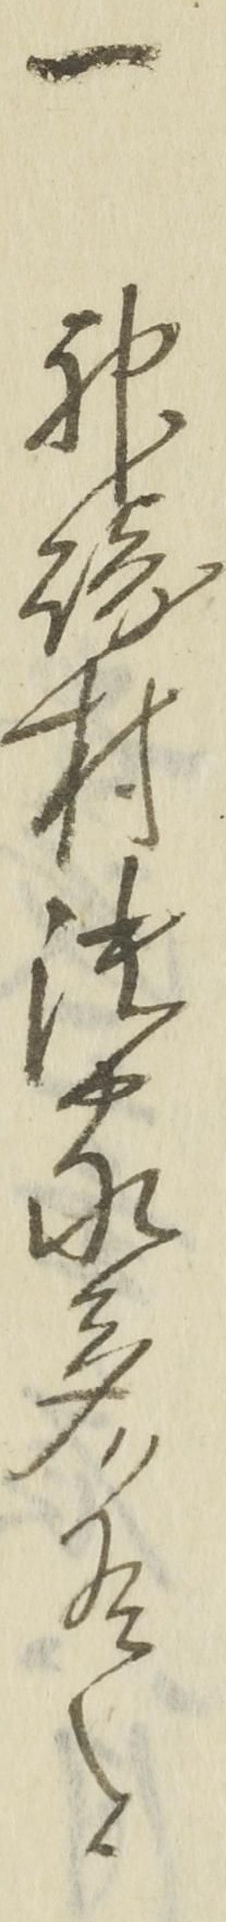一神崎村潰家多ク有之候
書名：安政乙卯江戸大地震筆記　安政丙辰八月大阪大雷雨之記追加　安政三辰年七月松前辺大地震并八月大風雨記録
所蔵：東京大学地震研究所図書室 Earthquake Research Institute Library, The University of Tokyo, JAPAN
